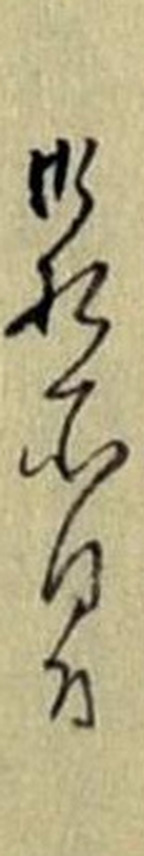御札所目付
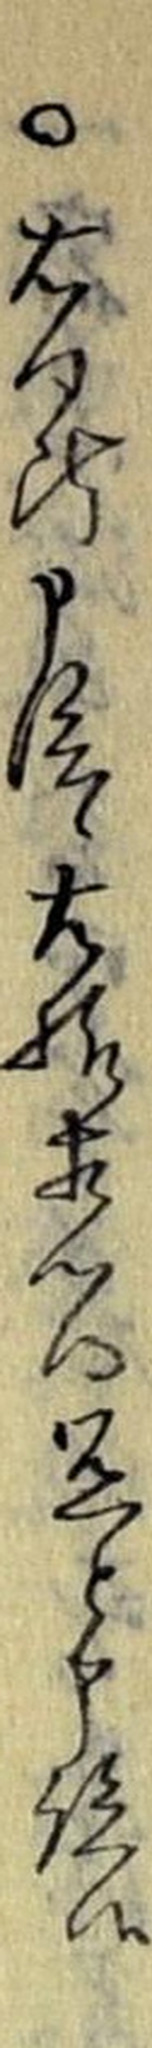○右同断申渡候左様相心得宜被申談候
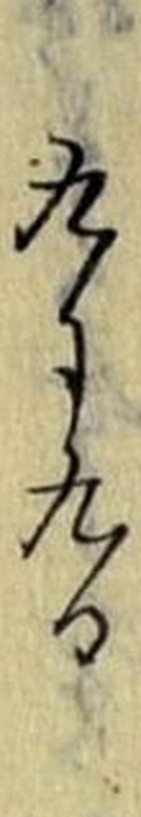九月九日
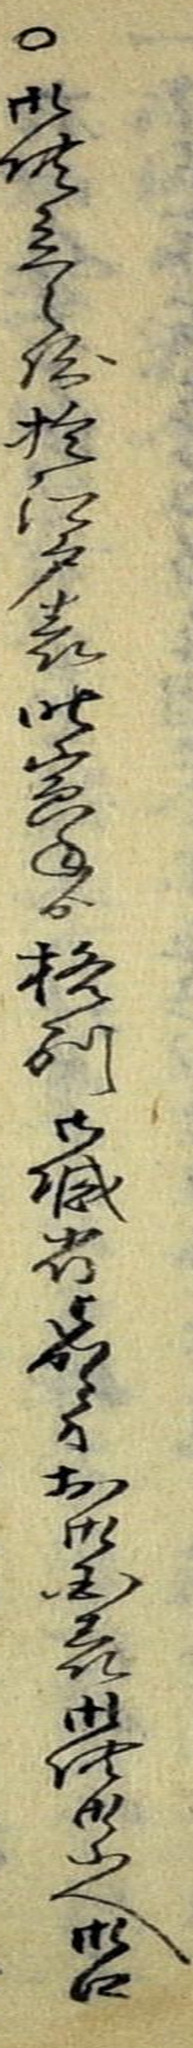○御供立之儀於江戸表昨寅年ゟ格別御減省被成候に付於御国表御供御小人御口
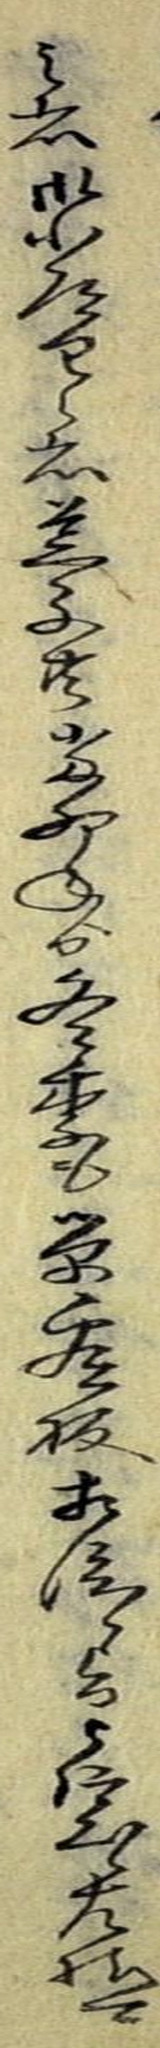之者御小道具之者荒子共当卯年ゟ冬季も単看板相渡候旨被仰出候左様可
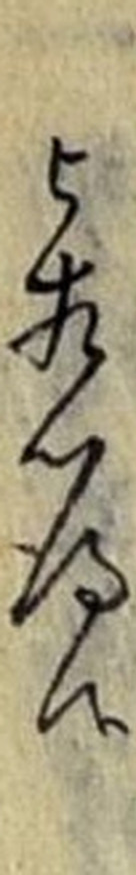被相心得候
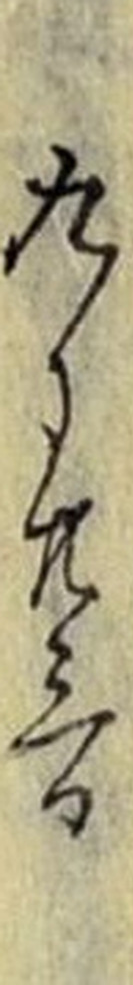九月廿三日
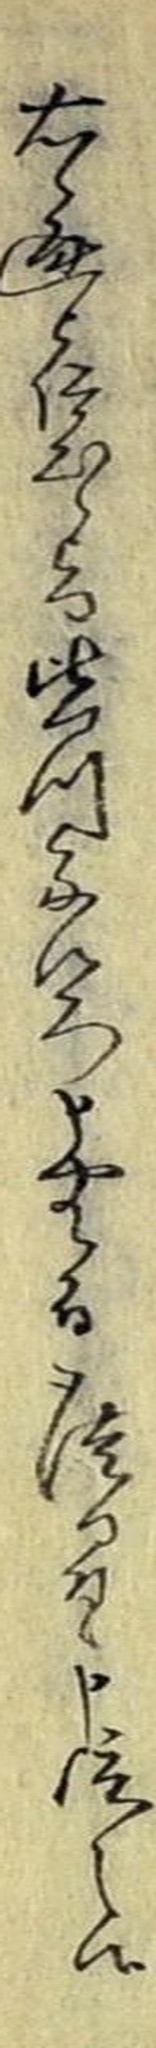右之通被仰出候旨皆川多左衛門申聞候に付御徒目付へ申渡之候
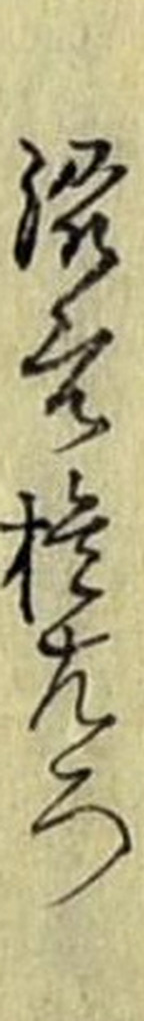渋谷権左衛門
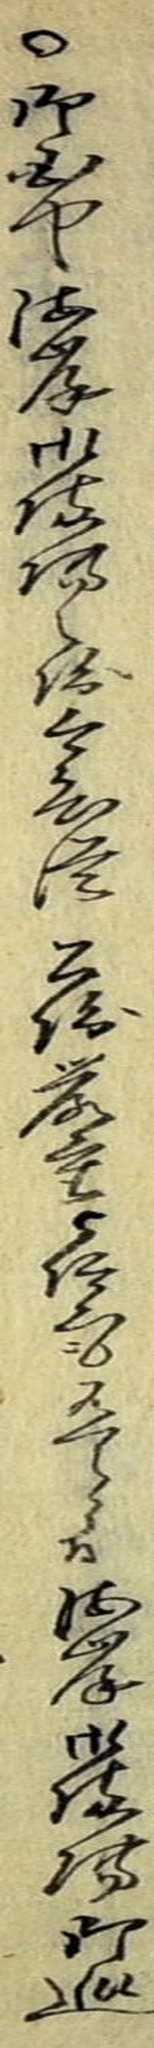○御国中海岸御備場之儀今度従公儀厳重被仰出も有之候に付海岸御備場御巡
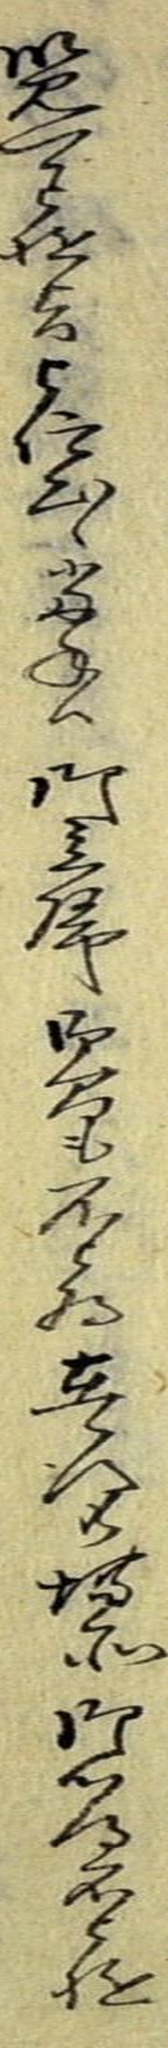覧可被遊旨被仰出候当年は御立帰御間も不被為在候得共場所御心得不被遊
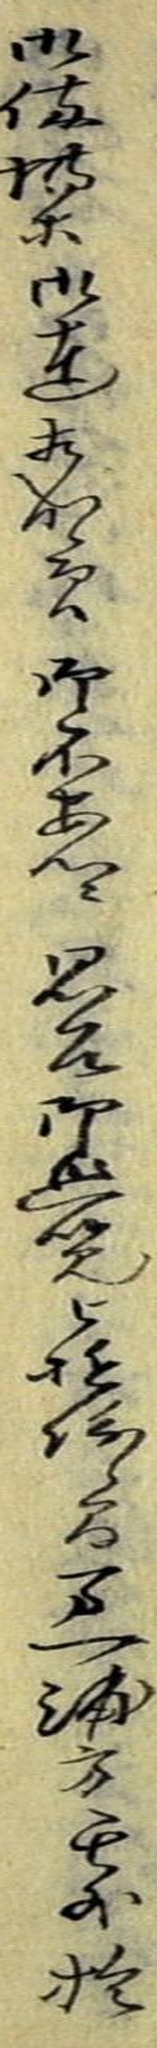御備場等御達相成候而は御不安心に思召御巡覧被遊儀に候間万一浦方其外於

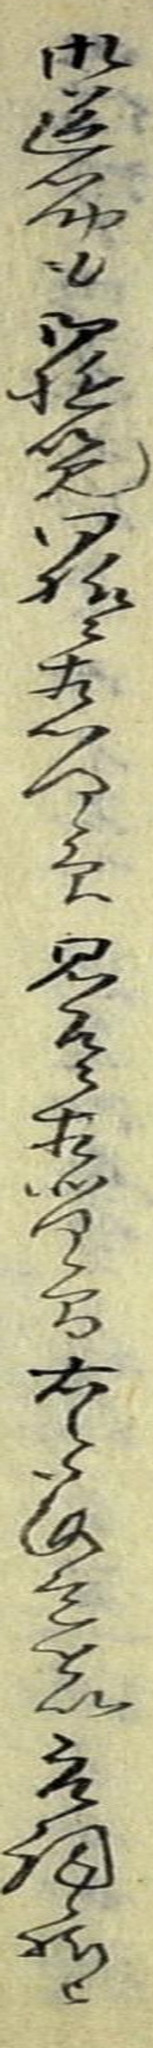御道筋も御遊覧同様に相心得候而は思召に相背候間右之御趣意を以取調候様被
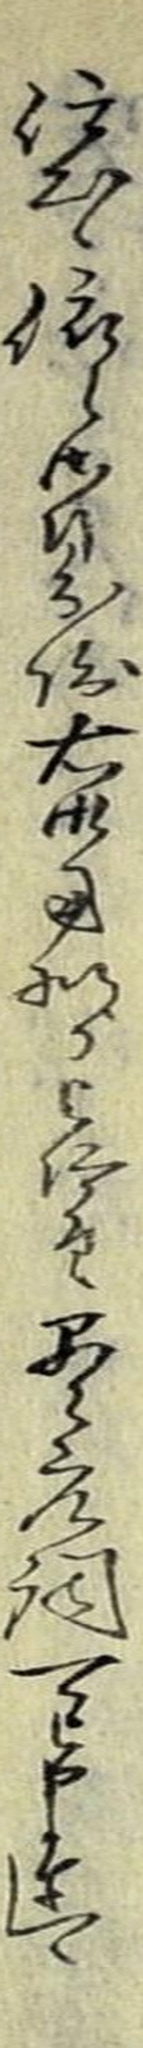仰出候依之御自分儀右御用掛り被仰付候早々取調可被申達候
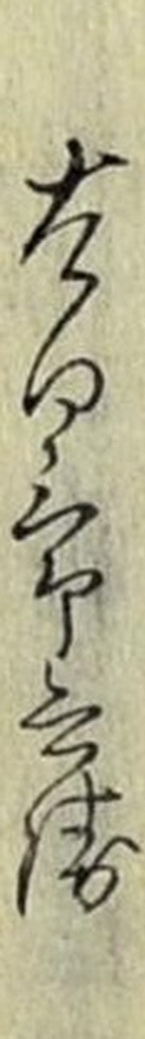太田三郎兵衛
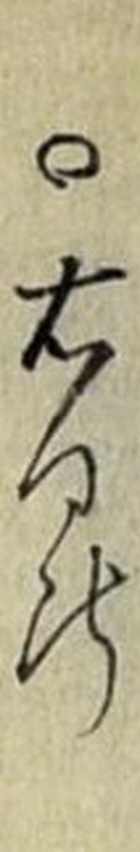○右同断
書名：命令之部 六
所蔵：福井県文書館 Fukui Prefectural Archives
